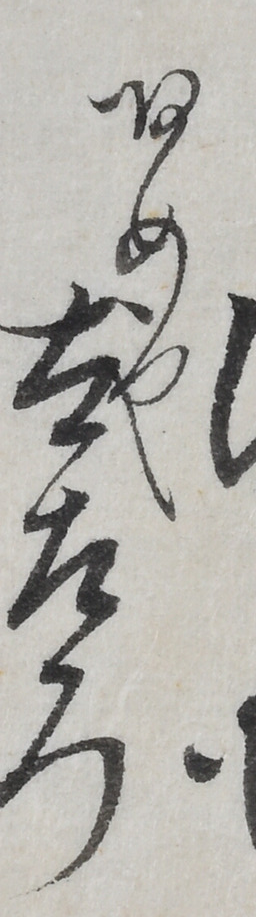吉左衛門
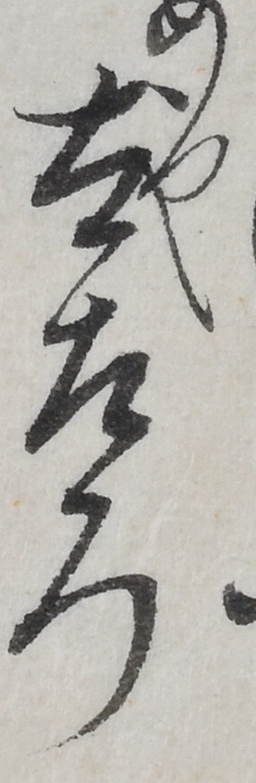吉左衛門
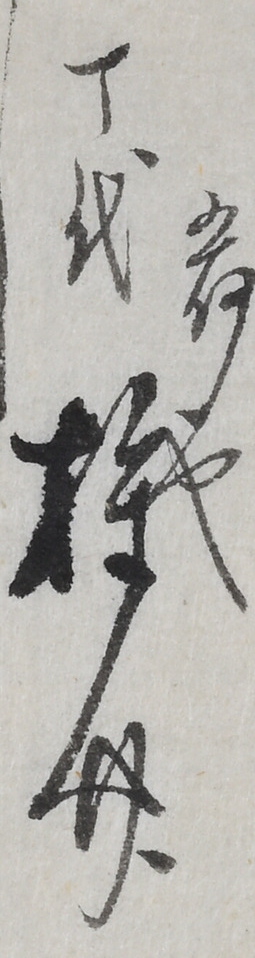丁代権介
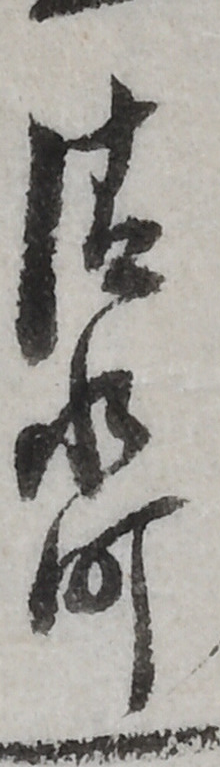清水町
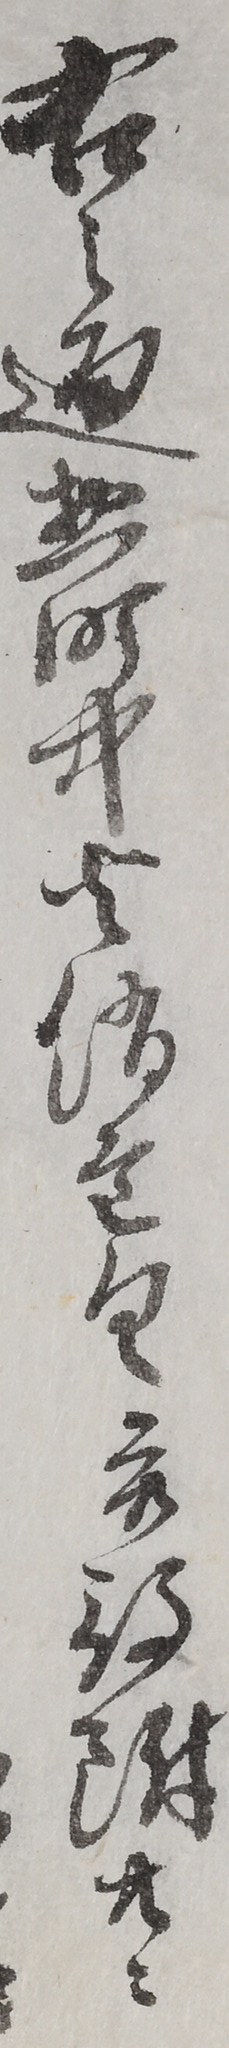右之通惣町中火消道具并役附共ニ
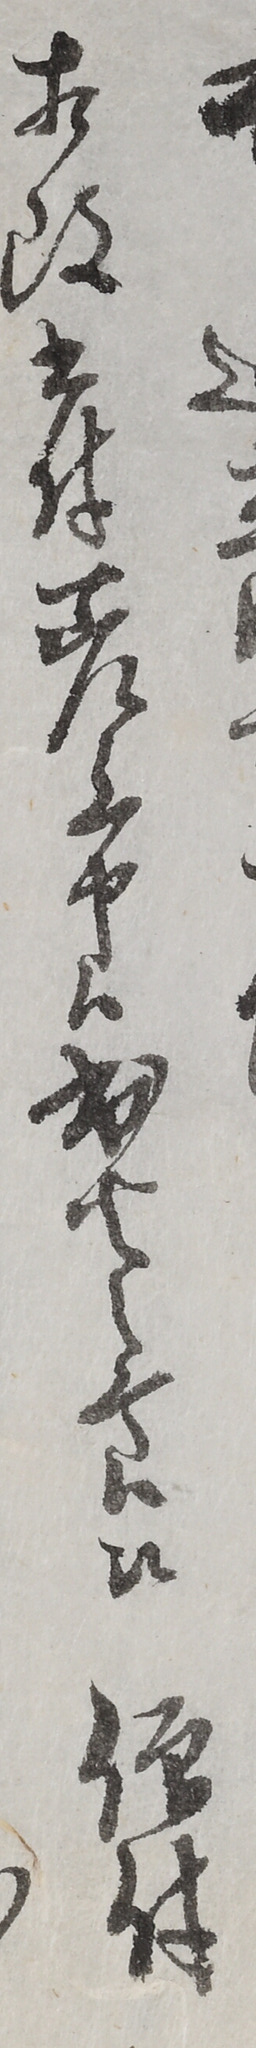相改書付差上申候火之節被仰付
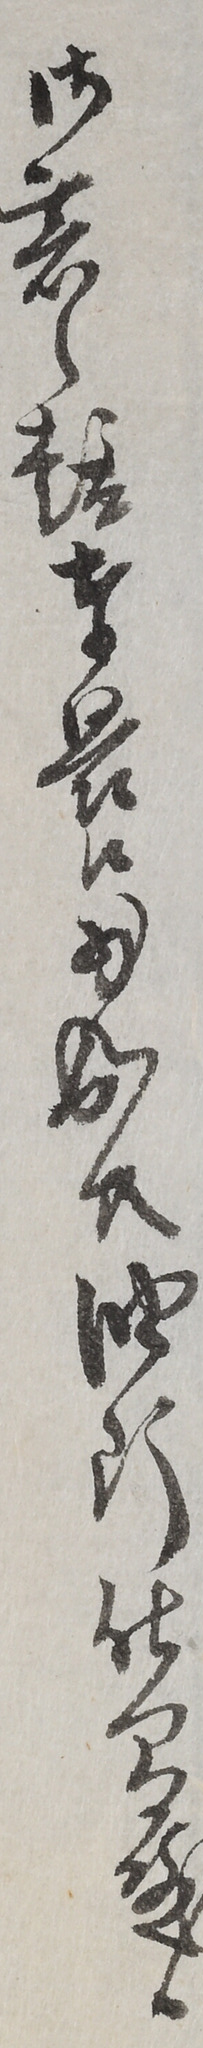御意之趣奉畏候少成共油断仕間敷候
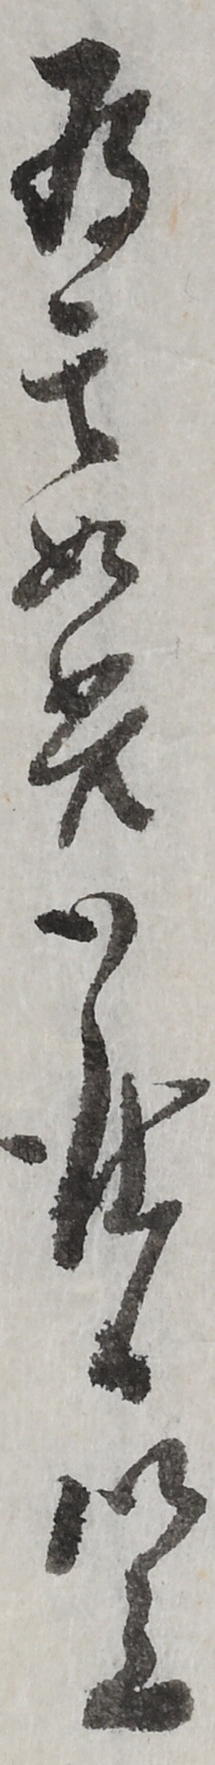為其如此御座候以上
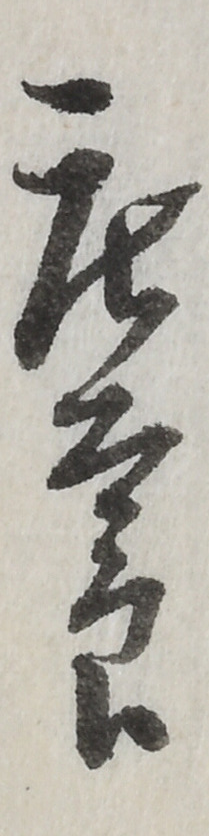庄太郎
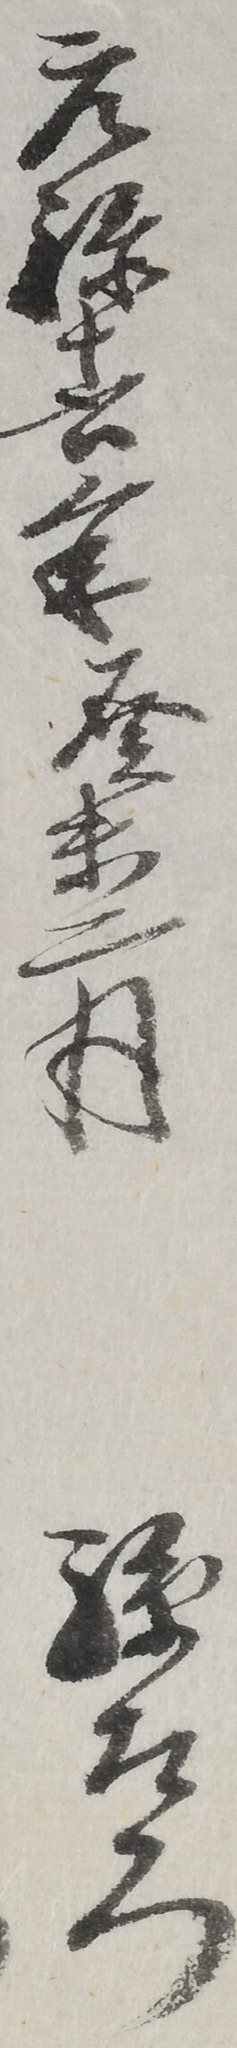元禄十六年癸未二月孫左衛門
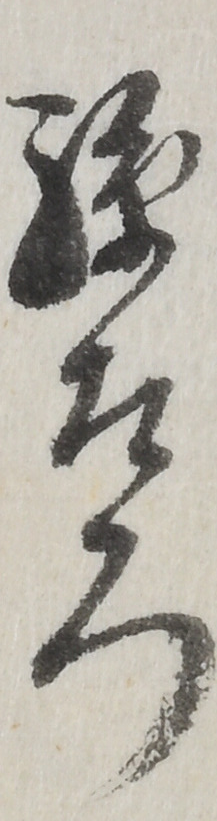吉左衛門
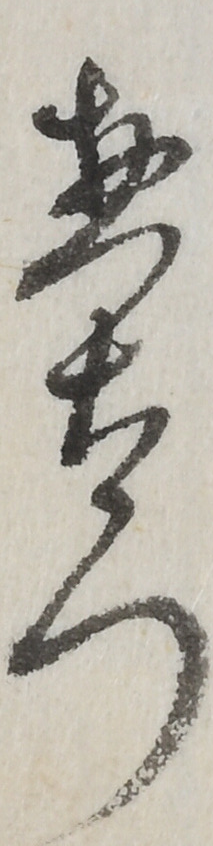惣右衛門
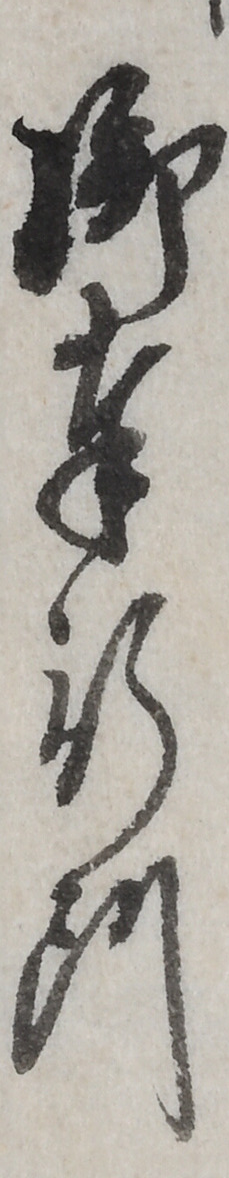御奉行所
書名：當町火消道具幷役附帳
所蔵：伊那市立高遠町図書館・合同会社AMANE
